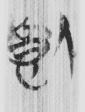飤
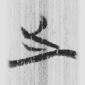之
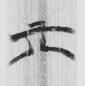亓
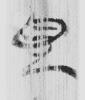見
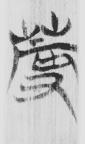蓐
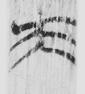夫
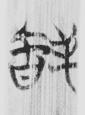{旨毛}
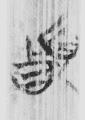{貞頁}
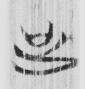足
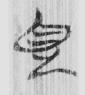見
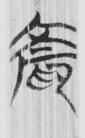{产色}
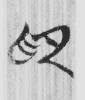色
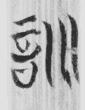訓
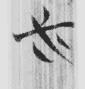必
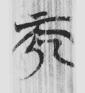而
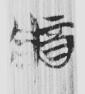𨟻
